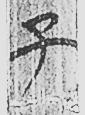子
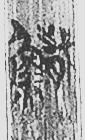鱥
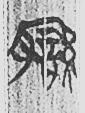䌛
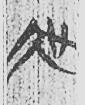吳
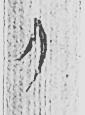人
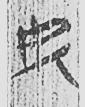𡚦
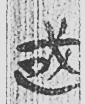或
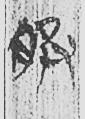服
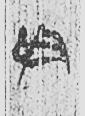於
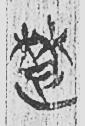楚
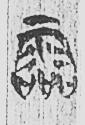霝
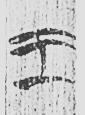王
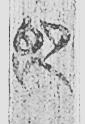即
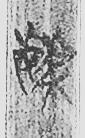殜
